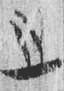之
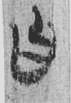曰
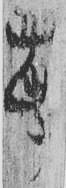○（一）
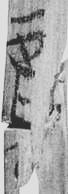言
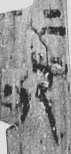而
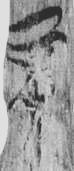不
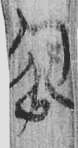○（窮）
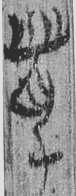○（一）
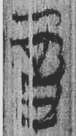言
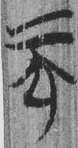而
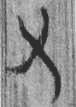又（有）
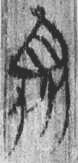衆
